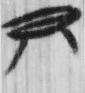尹
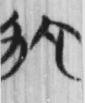{力它}
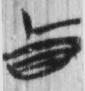貞
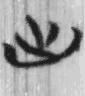出
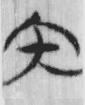內（入）
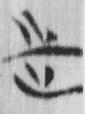寺（侍）
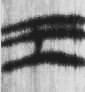王
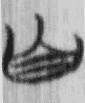自
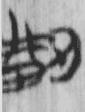○（荆）
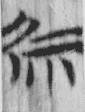𫵖
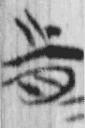之月
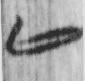㠯（以）
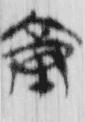○（就）
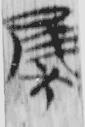集
